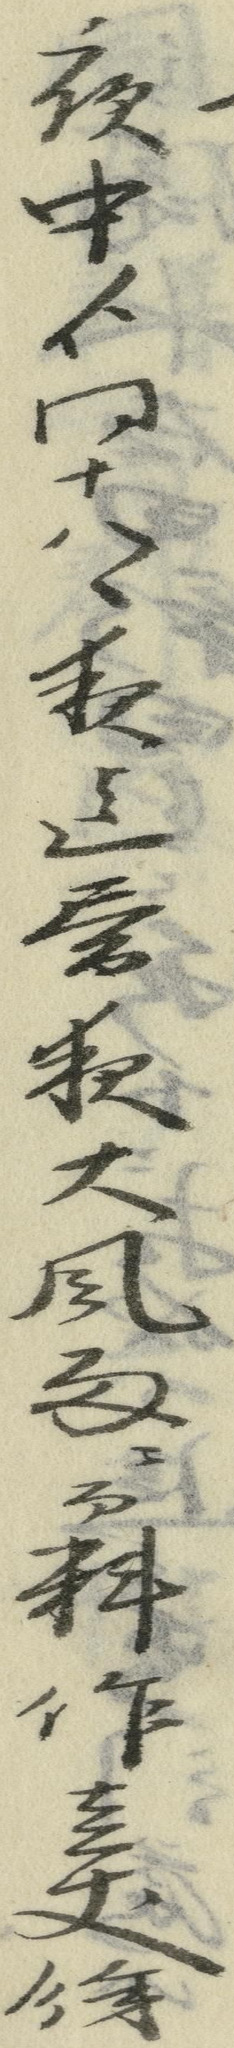夜中ゟ同十八日夜迄昼夜大風雨ニ而料作壱丈餘

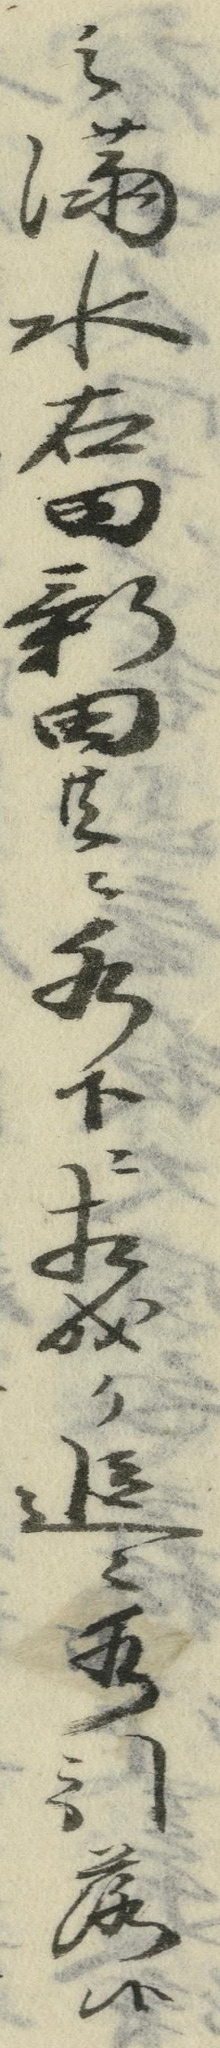之満水右田新田共ニ水下ニ相成リ追々水引落候
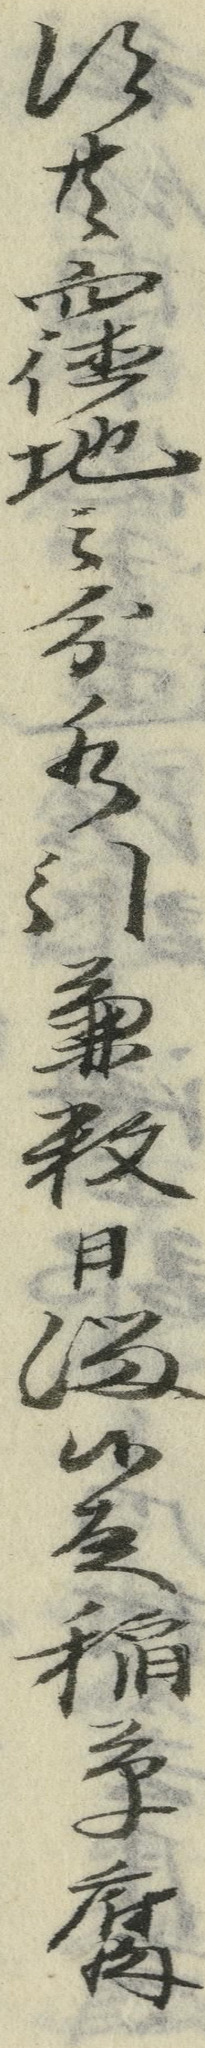得共窪地之分水引兼数日溜候故稲草腐
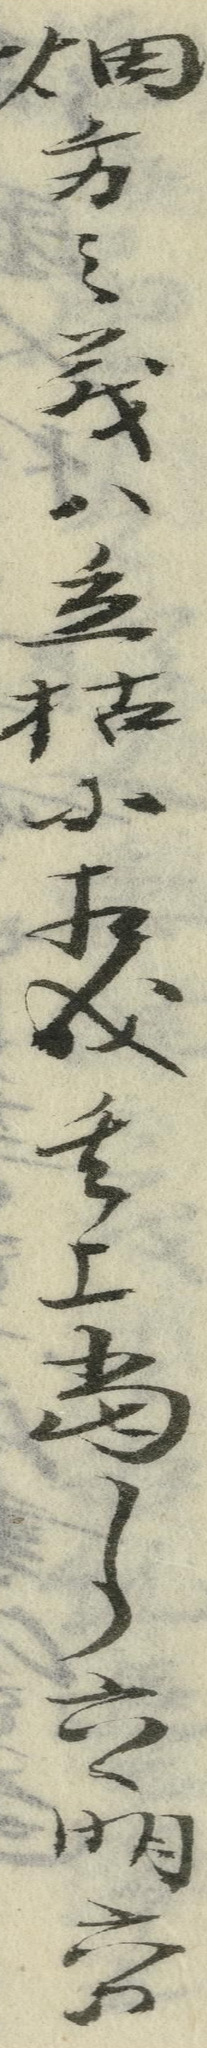畑方之義は立枯に相成其上当月六日明六つ
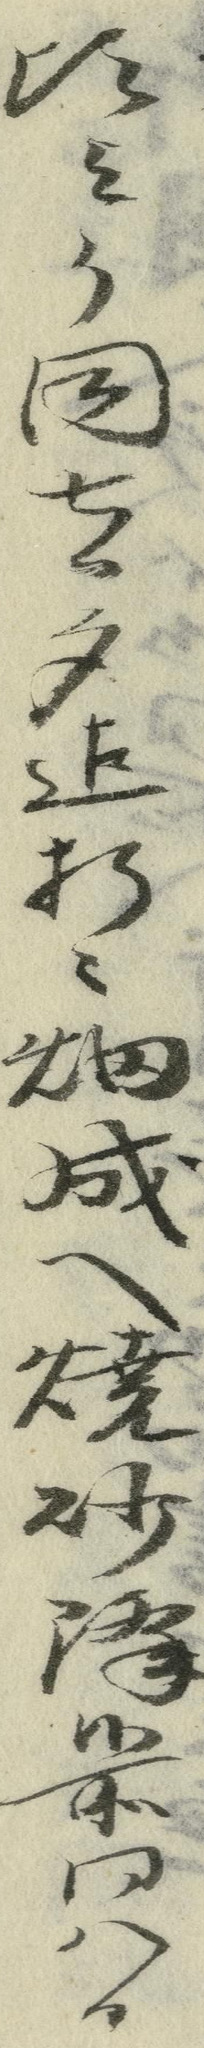頃より同七日夕迄折々畑成へ焼砂降候所同八日
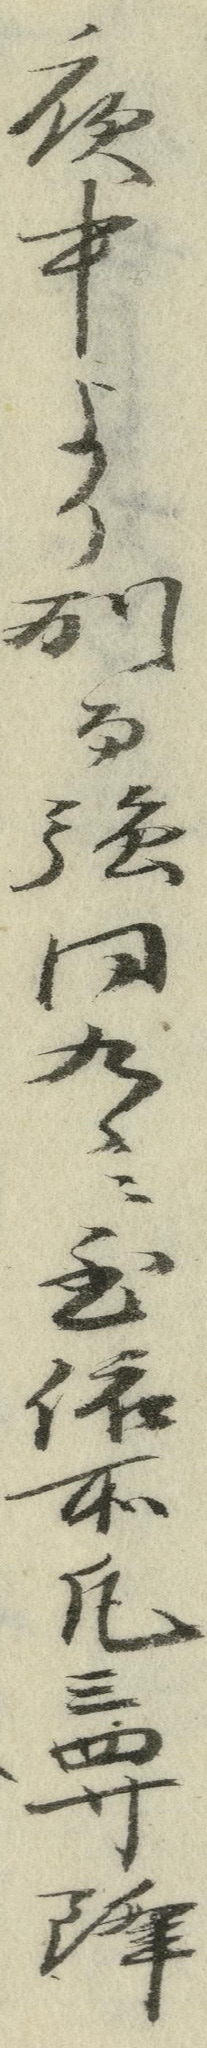夜中より別而強同九日ニ至依所凡三四寸降
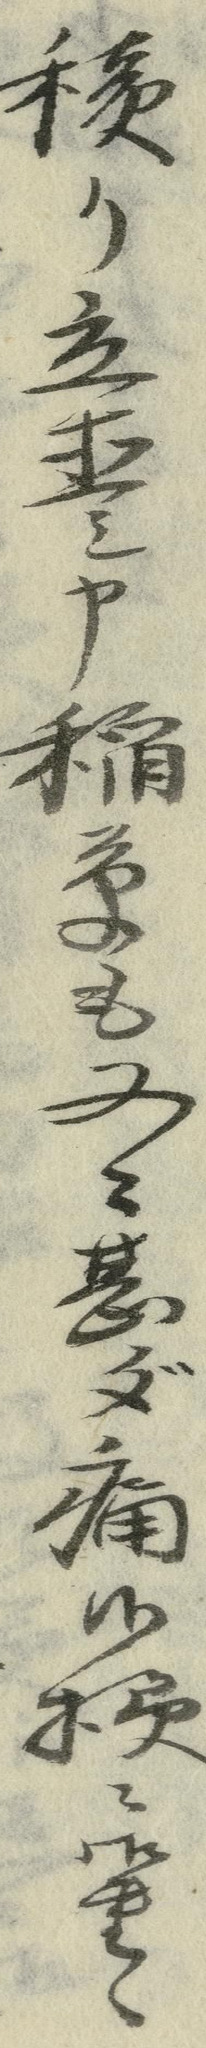積り立直シ申稲草も又々甚ダ痛候様ニ御座候
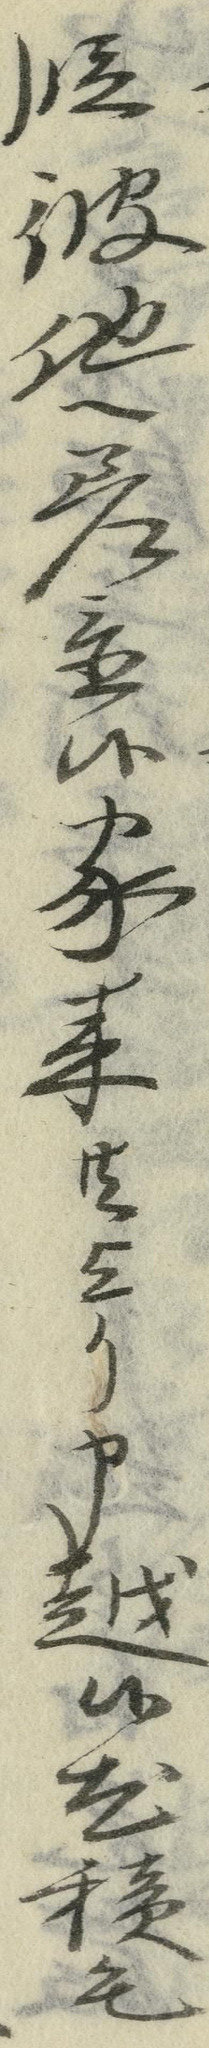段彼地ヘ差置候家来共より申越候尤積毛
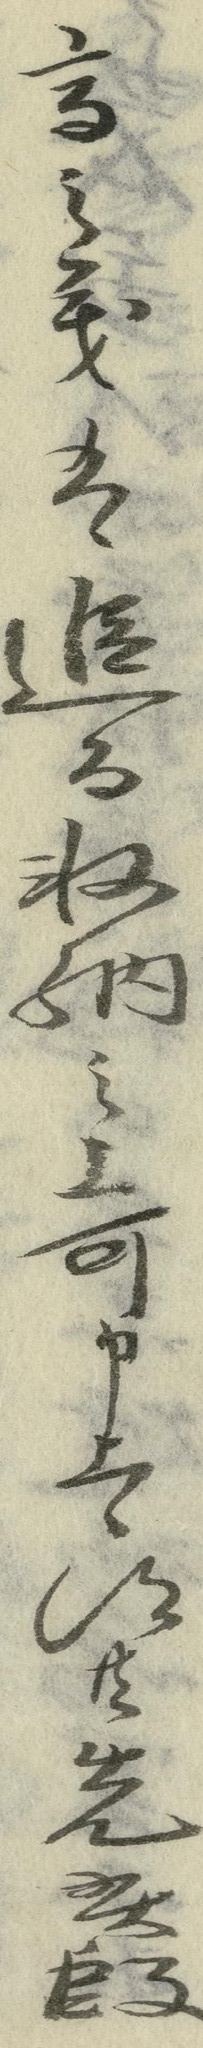高之義は追而収納之上可申上候得共先此段
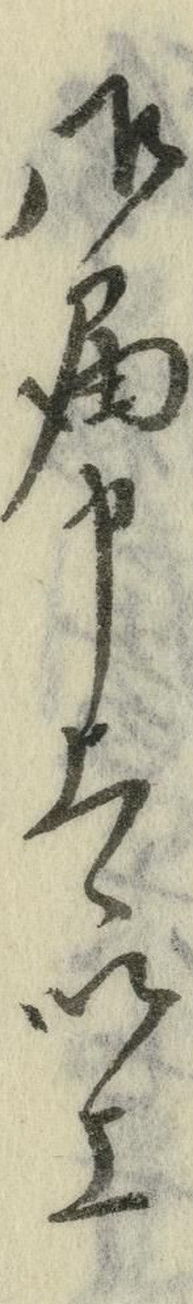御届申上候以上
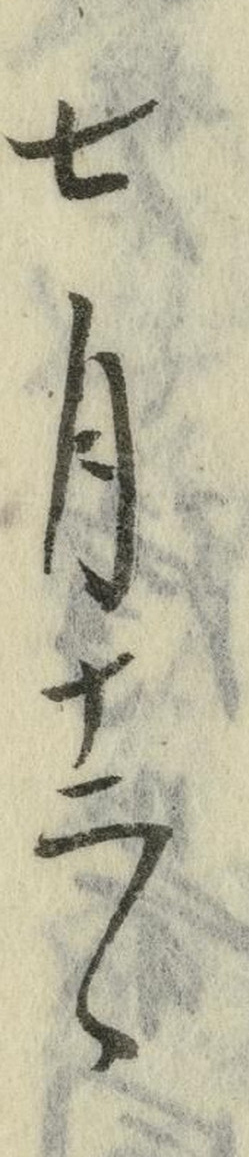七月十二日
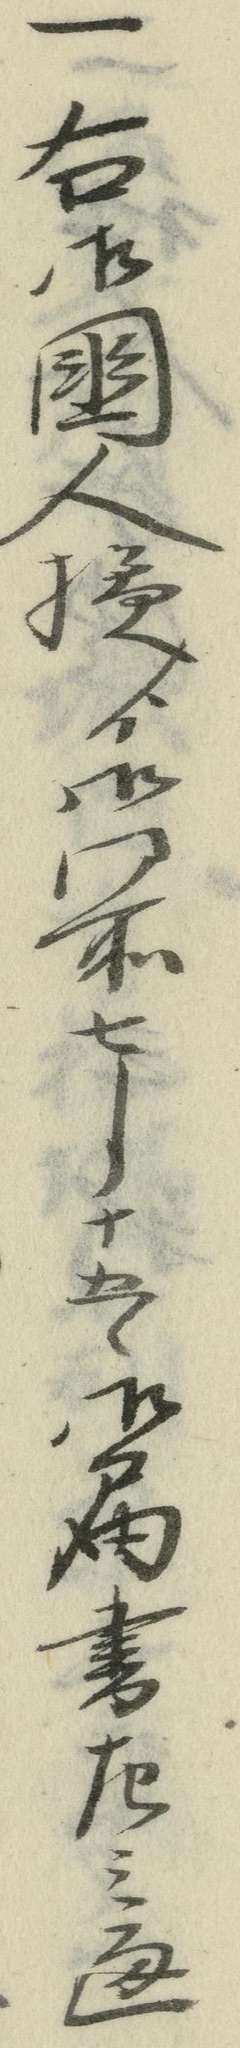一右御国人様ゟ御同所七月十五日御届書左之通
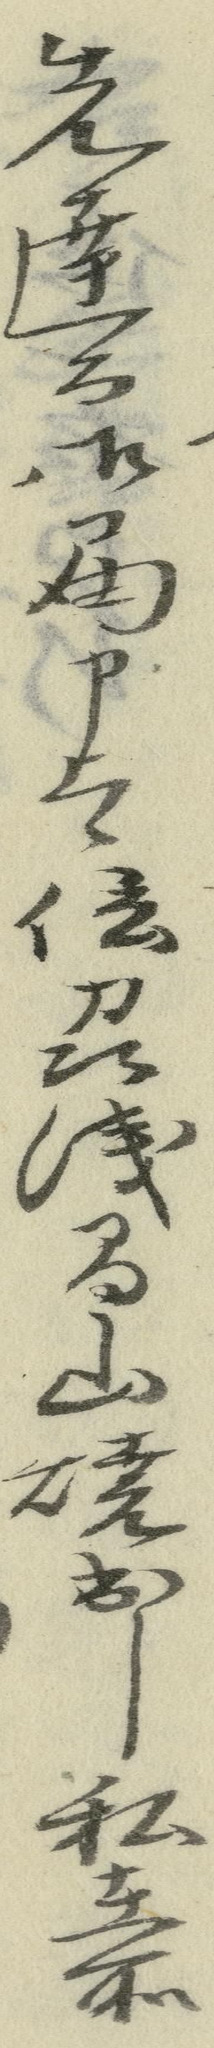先達而御届申上候信州浅間山焼出し私在所
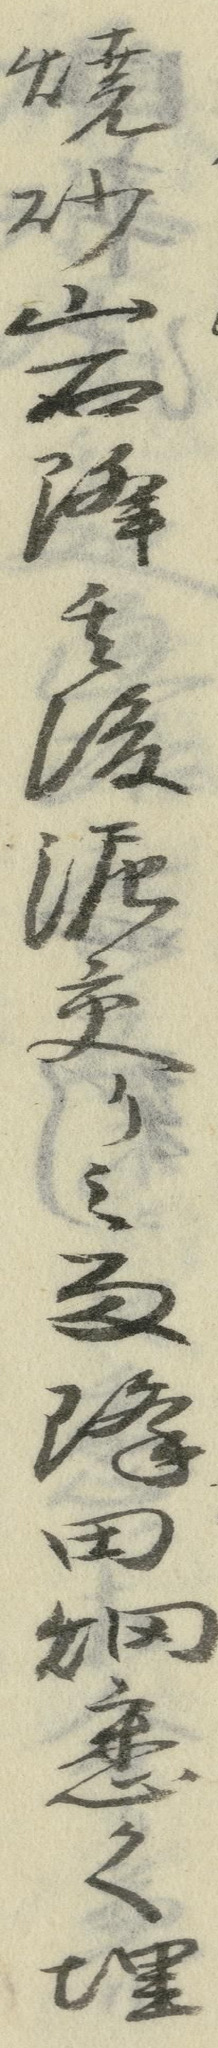焼砂岩降其後泥交リ之雨降り田畑悉く埋
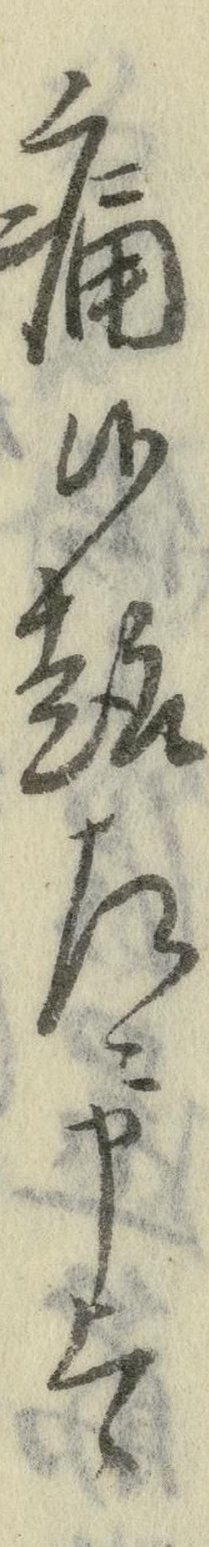痛候趣左ニ申上候
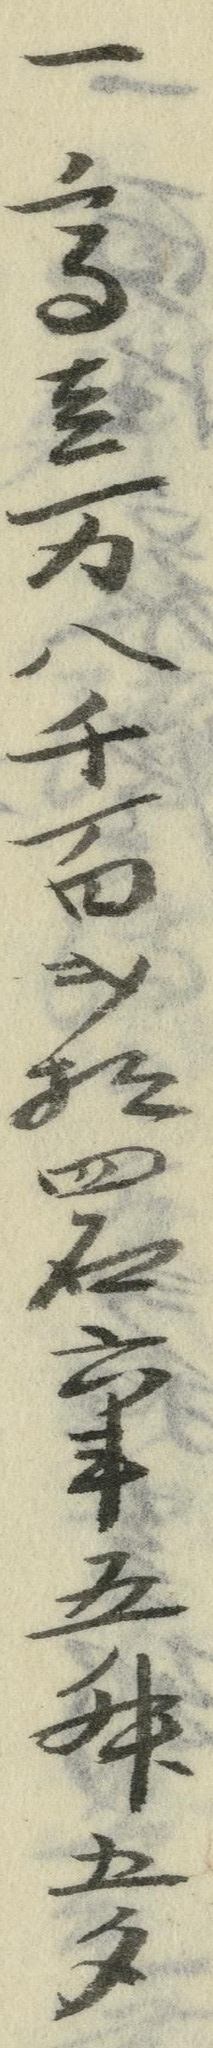一高壱万八千百弐拾四石六斗五升五勺
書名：天明三癸卯七月信州浅間山焼出シ上州山津浪ニ付近國ヨリ御届書并訴書写
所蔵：東京大学地震研究所図書室 Earthquake Research Institute Library, The University of Tokyo, JAPAN
